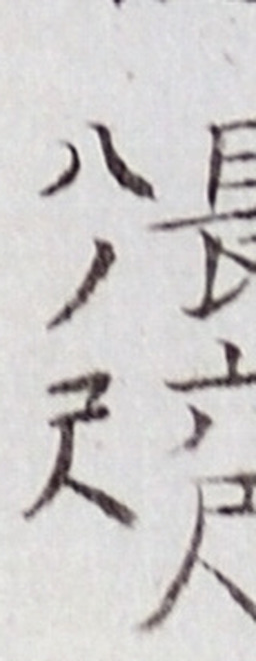八ノ尺
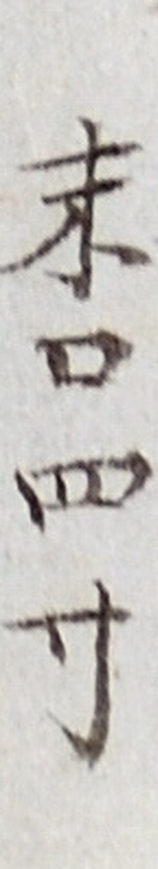末口四寸
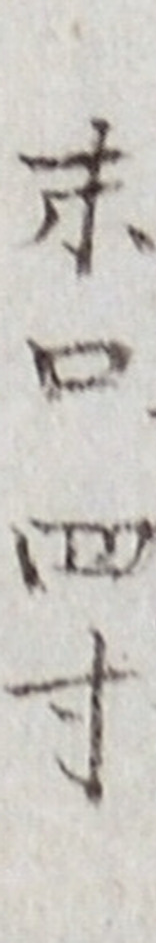末口四寸
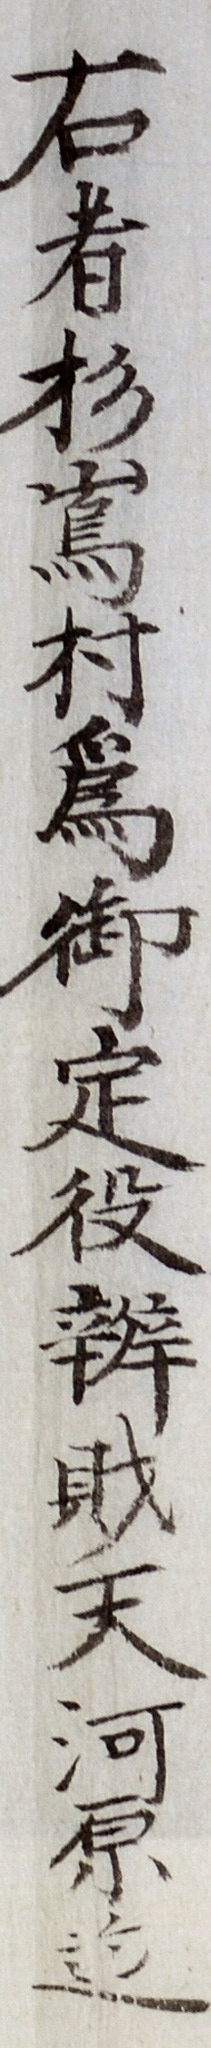右者杉嶌村為御定役弁財天河原迄
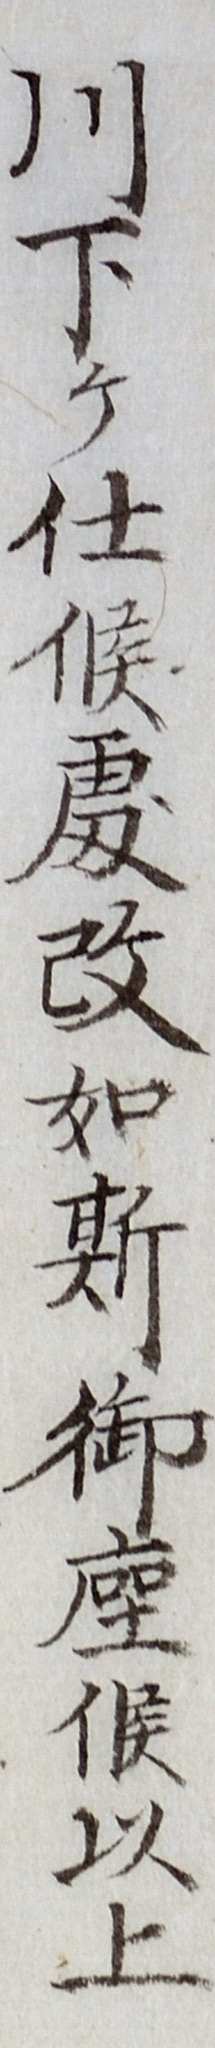川下ケ仕候処改如斯御座候以上
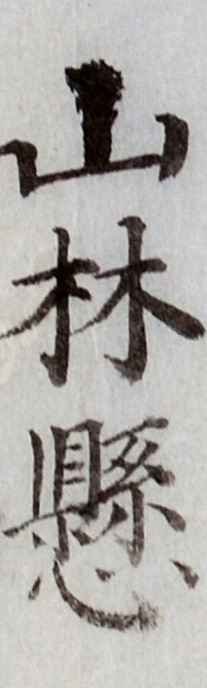山林懸
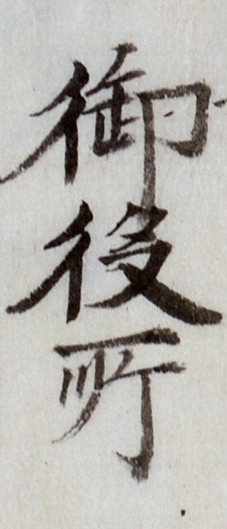御役所

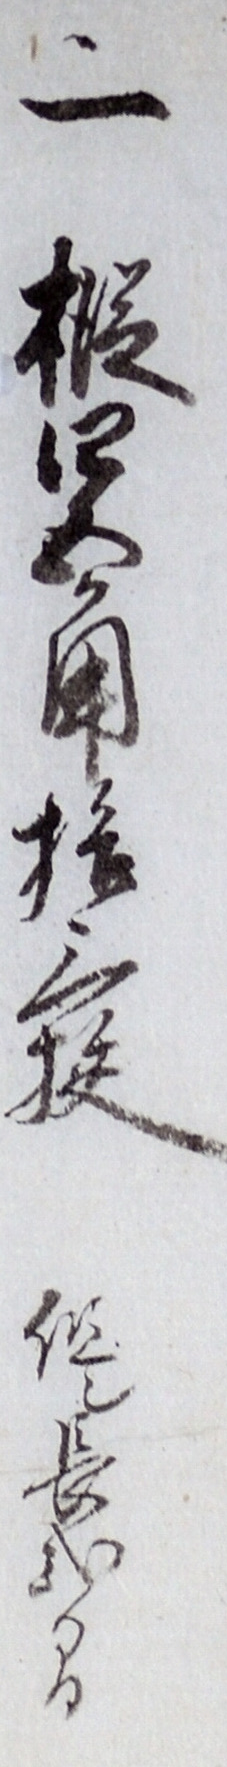一樅四五角拾三挺但シ長弐間
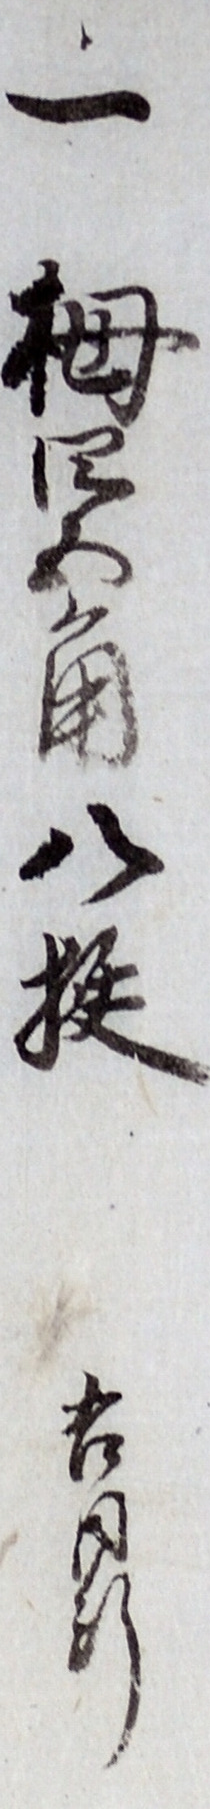一栂四五角八挺右同断
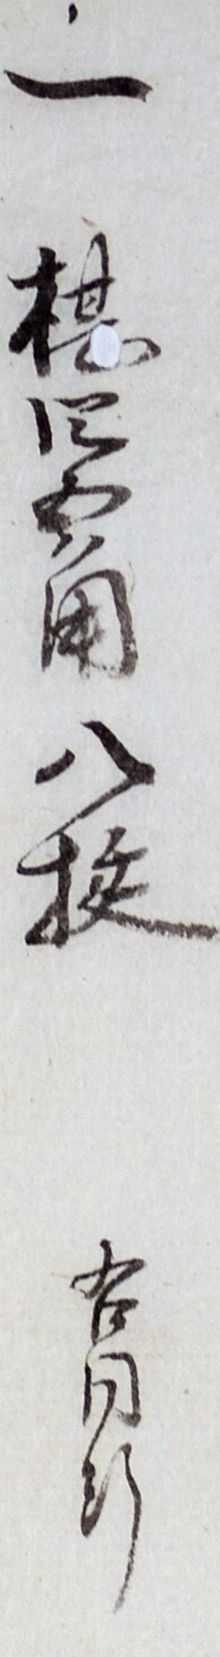一椹四五角八挺右同断
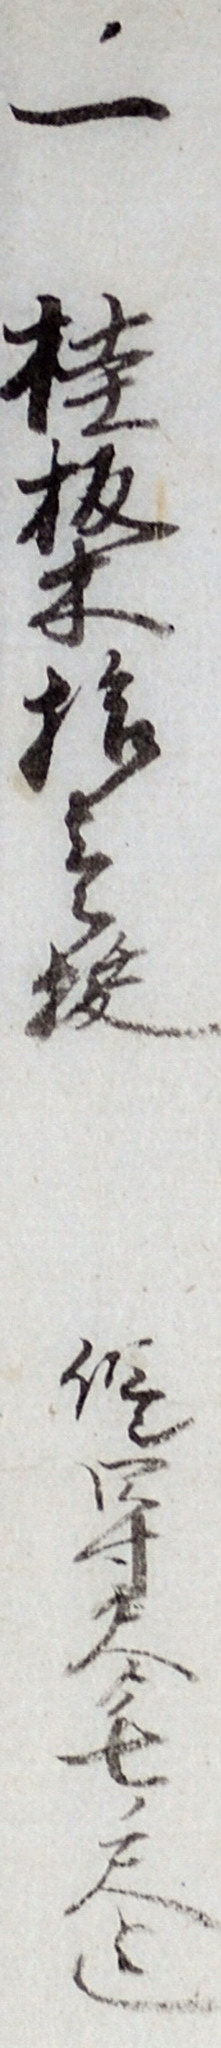一桂板木拾壱挺但シ四寸尺ゟ七ノ尺迄
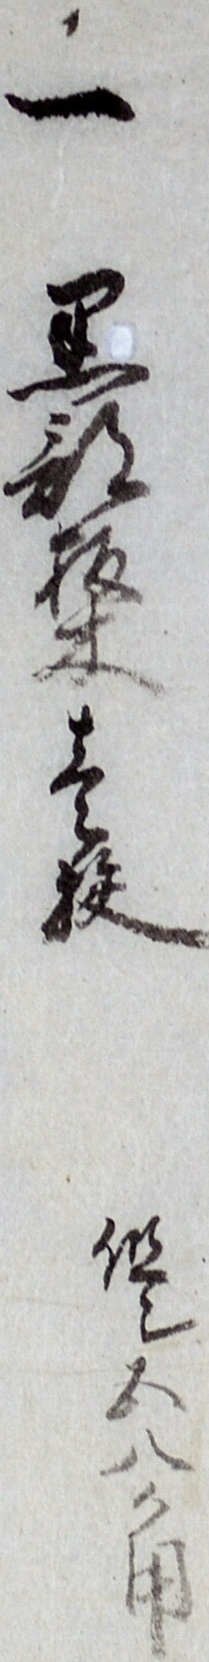一黒部板木壱挺但シ五八角
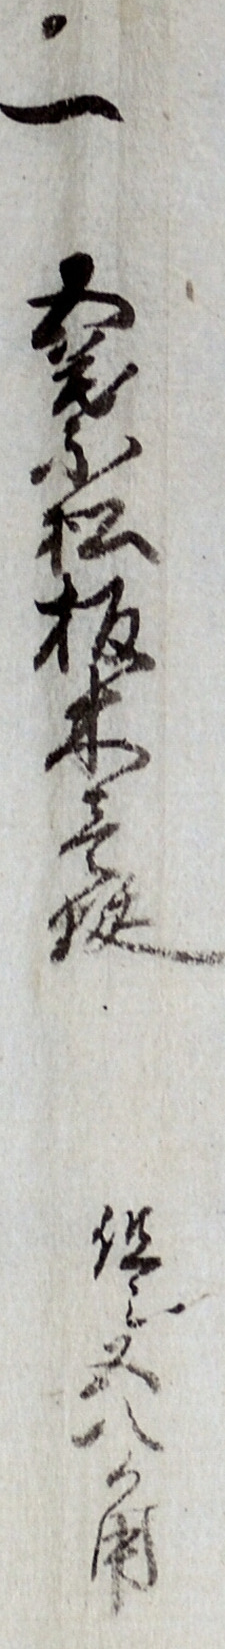一五葉松板木壱挺但シ五八角
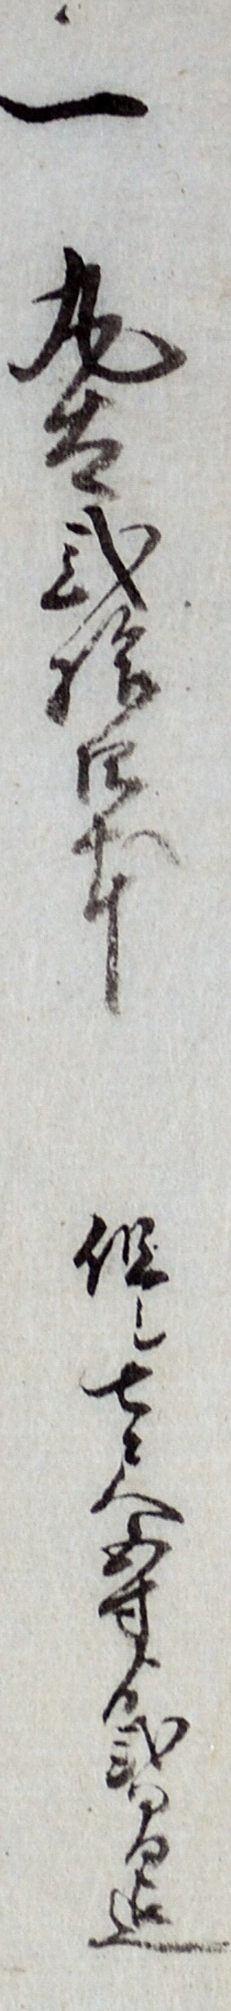一丸太弐拾四本但シ七尺五寸ゟ弐間迄
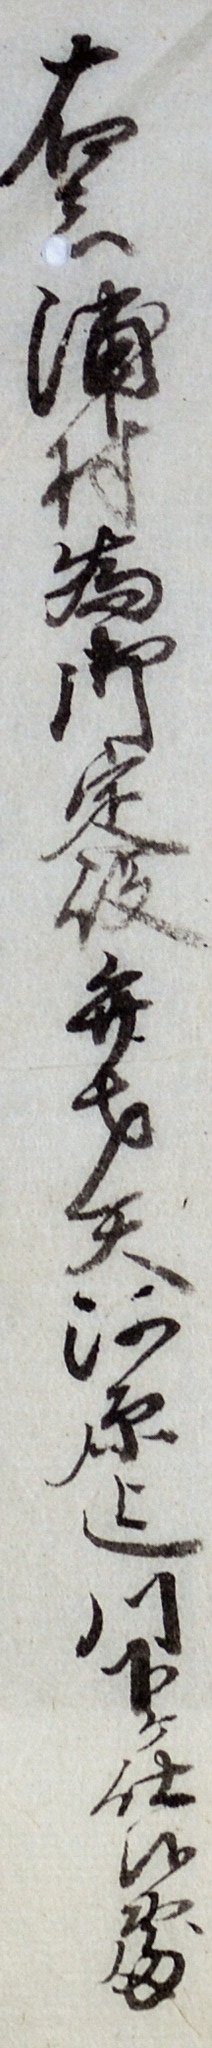右者浦村為御定役弁才天河原迄川下ケ仕候処
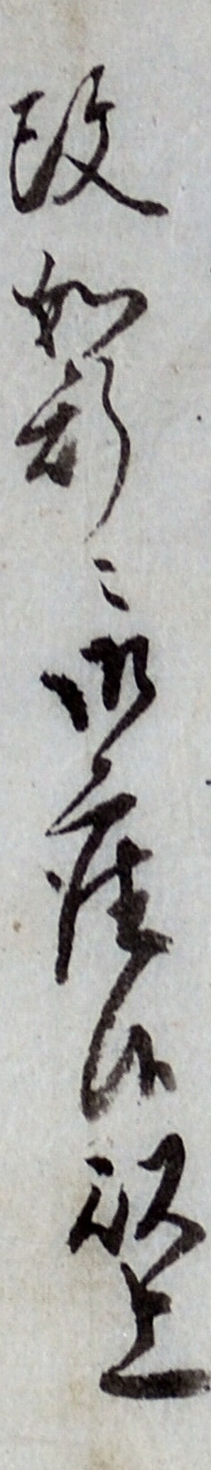改如斯ニ御座候以上
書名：記
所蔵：伊那市立高遠町図書館・合同会社AMANE
